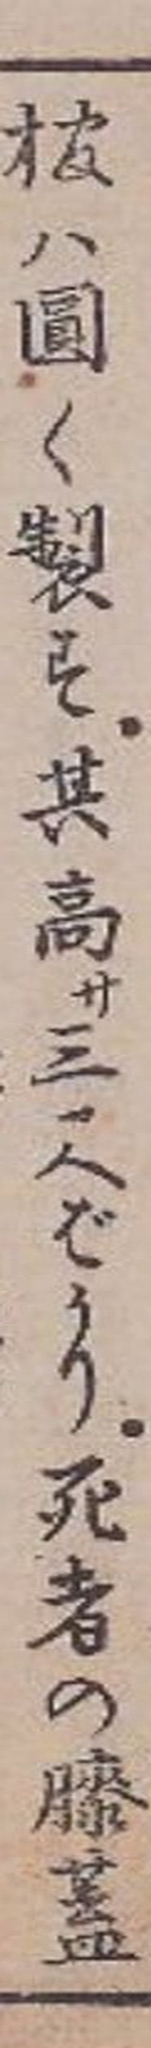棺は円く製す、其高三尺ばかり、死者の膝蓋
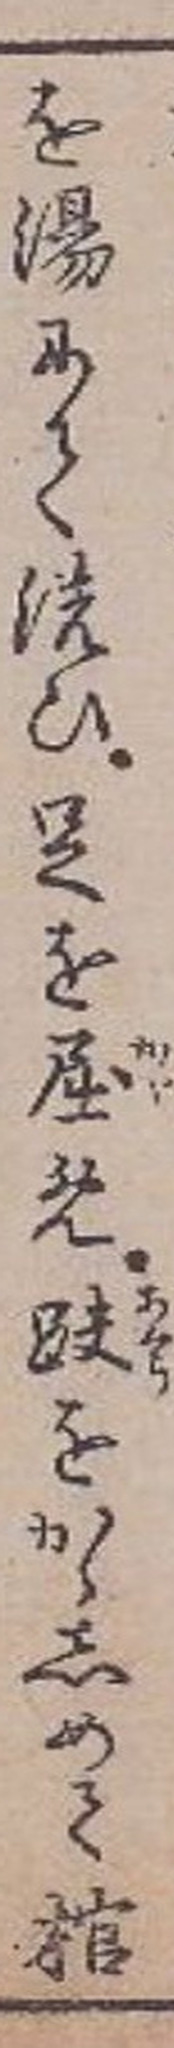を湯にて洗ひ、足を屈め、趺をかゝしめて棺
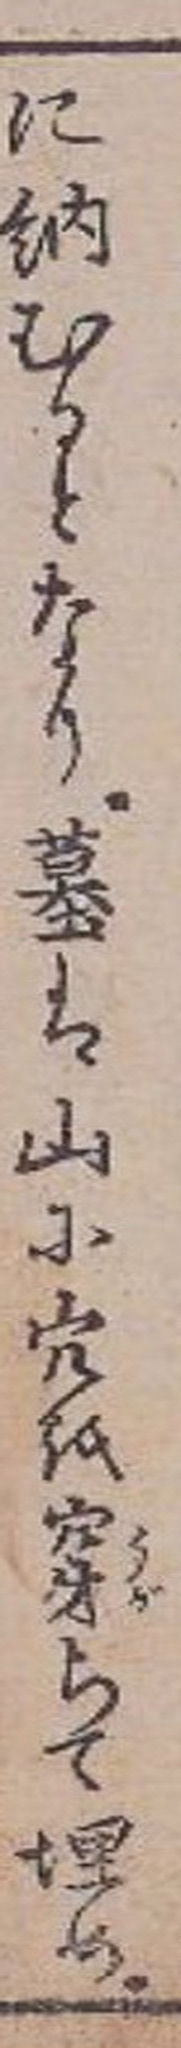に納むるとなり、墓は山に穴を穿ちて埋め、
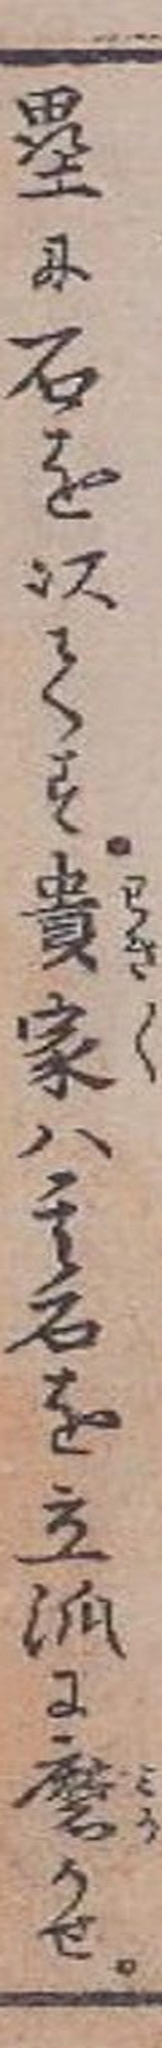塁に石を以てす、貴家は其石を立派に磨かせ、

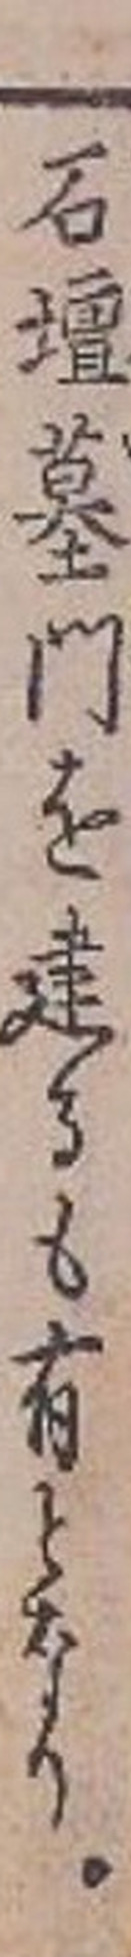石壇墓門を建るも有となり、
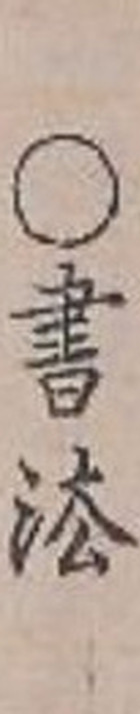○書法
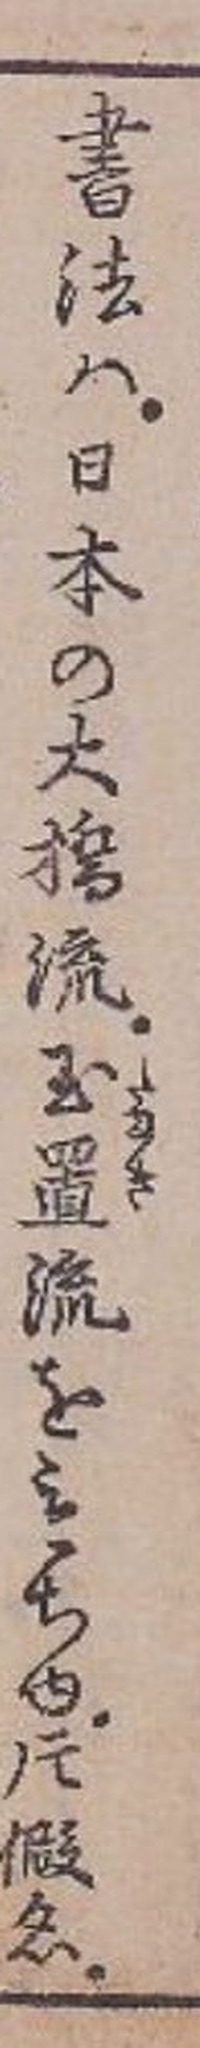書法は、日本の大橋流、玉置流をもちゆ、片仮名、
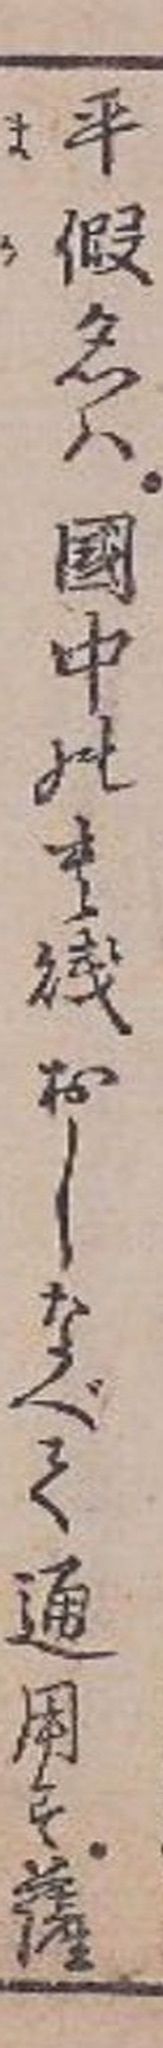平仮名は、国中の貴賤おしなべて通用す、薩
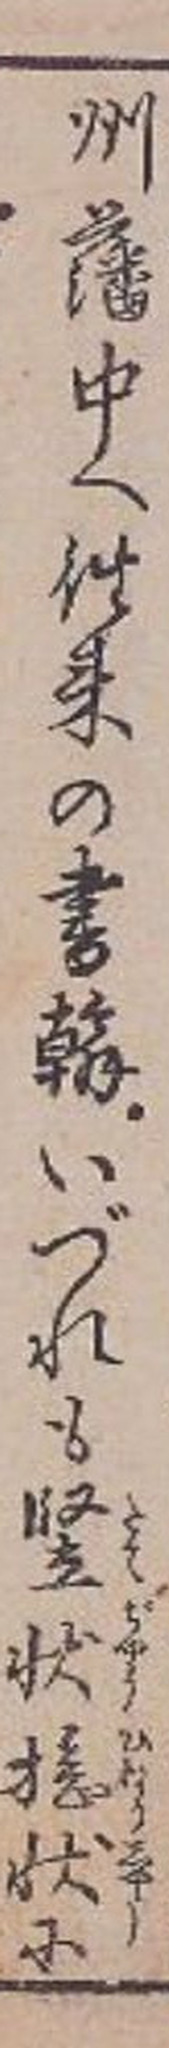州藩中へ往来の書翰、いづれも竪状捻状に
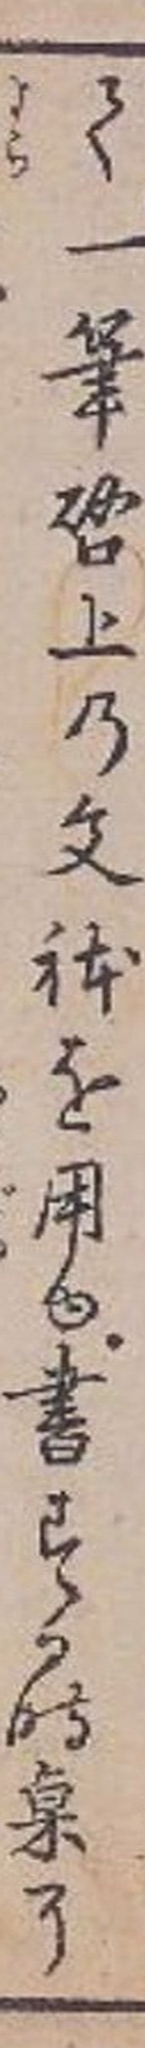て、一筆啓上の文体を用ゆ、書する時桌に
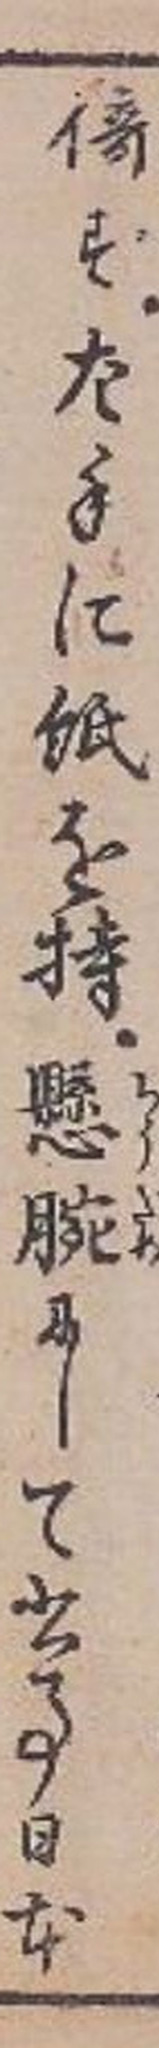倚ず、左手に紙を持、懸腕にして書事日本
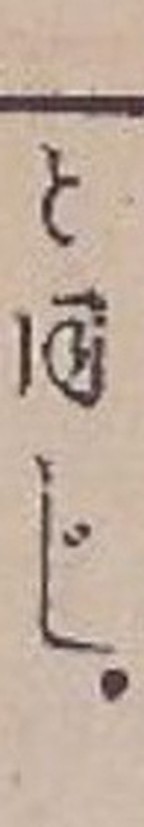と同じ、
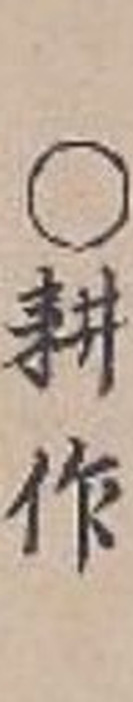○耕作
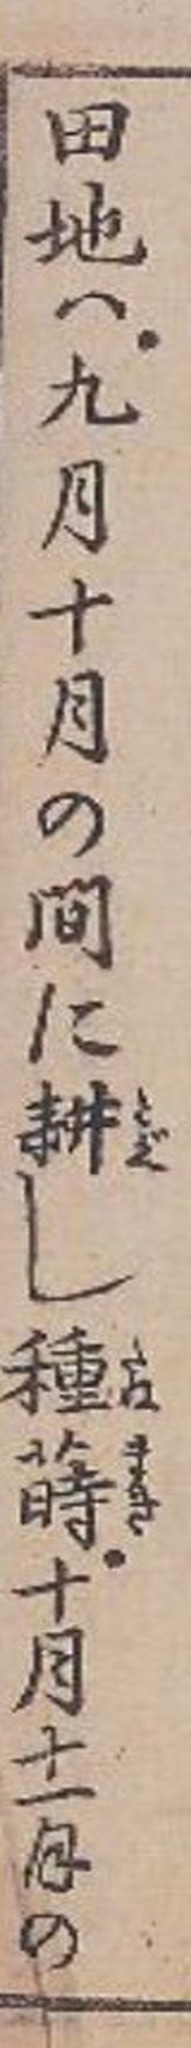田地は、九月十月の間に耕し種蒔、十月十一月の
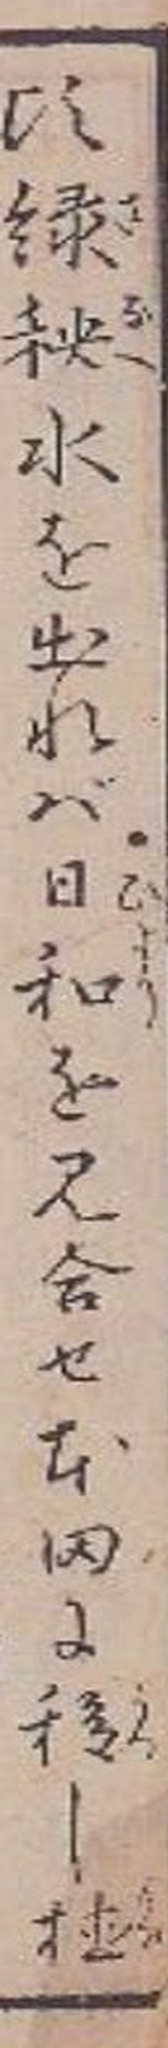頃緑秧水を出れば、日和を見合せ本田に移し植
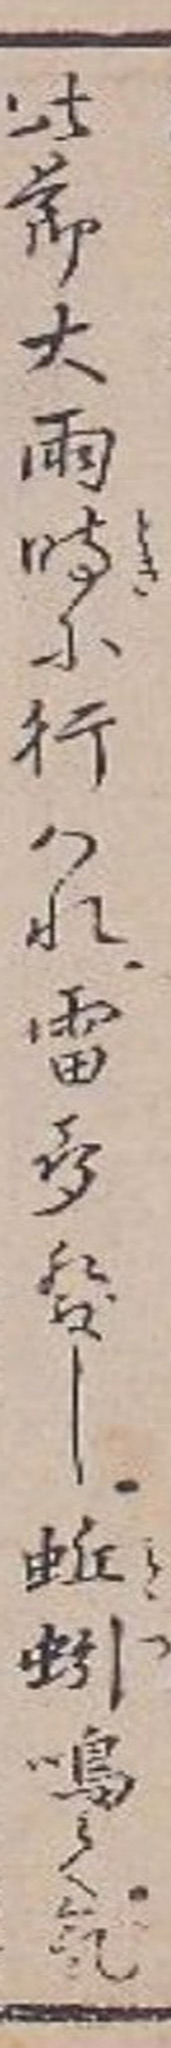此節大雨時に行はれ、雷声発し、蚯蚓鳴く、気
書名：琉球談
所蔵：University of the Ryukyus Library
